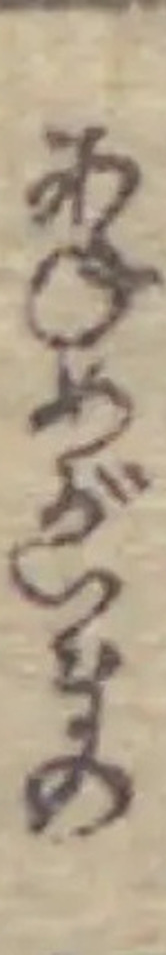あねめがいまの
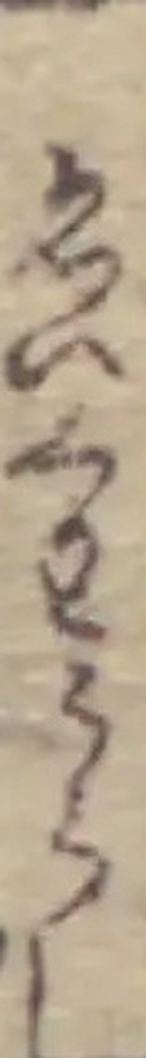かついくわうら
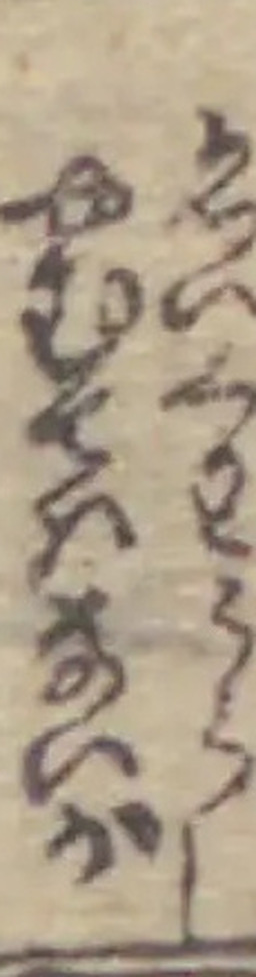やむてはないが
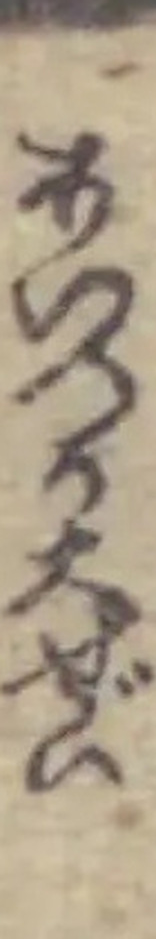あいつか大ぜい
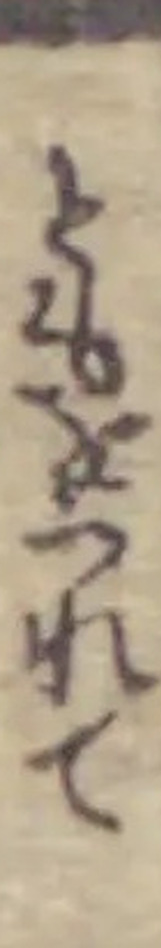ともをつれて
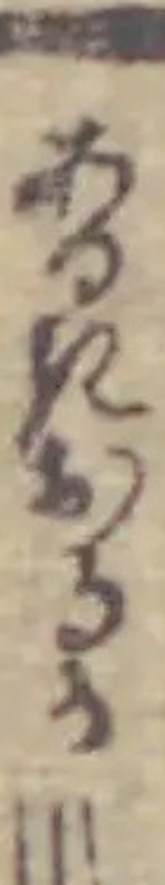あるきおるか
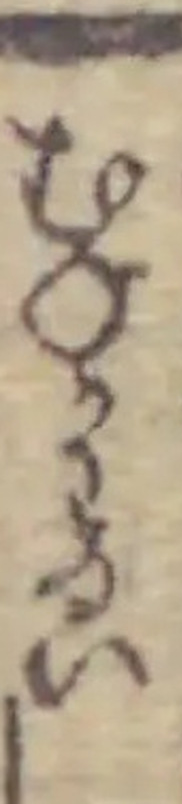むねかわるい
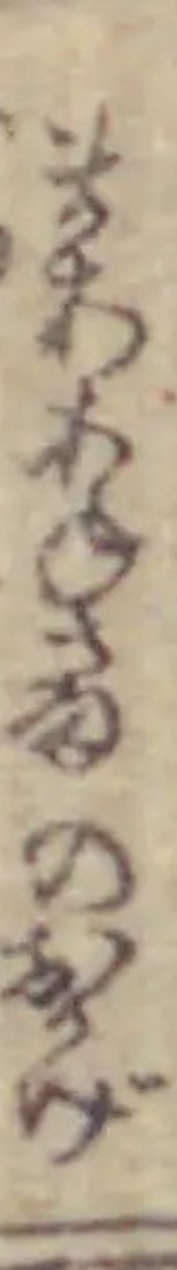まああねさまのおかげ
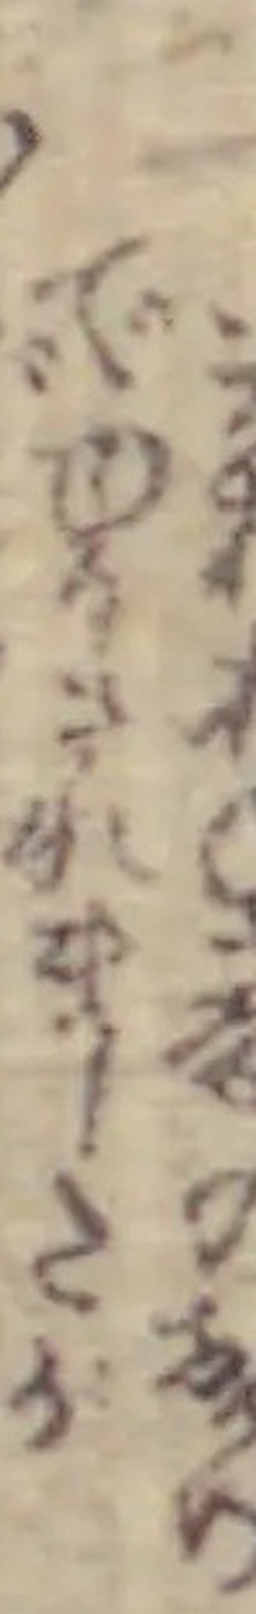でゆるされましたが
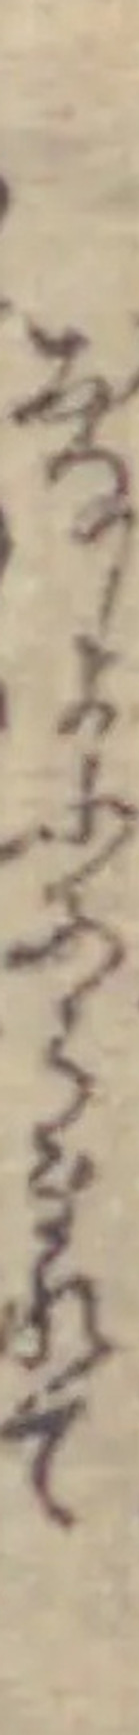おなしよふにうまれて
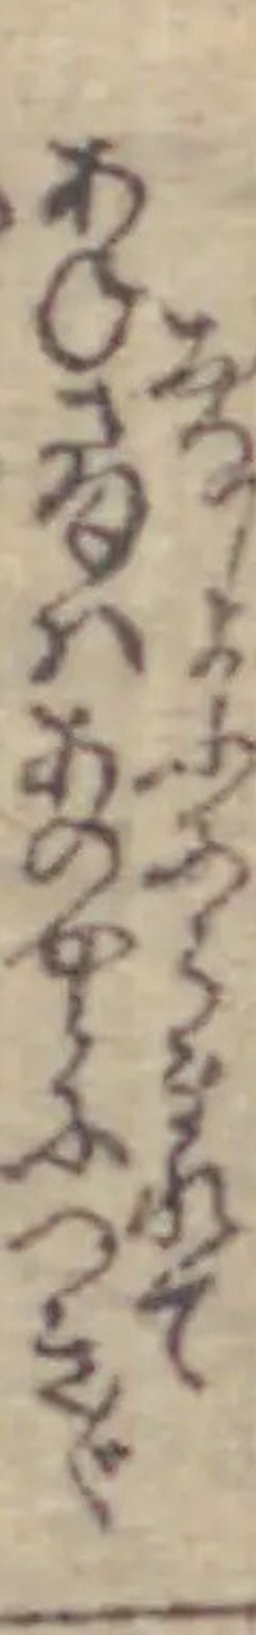あねさまはあのやふにつき〴〵
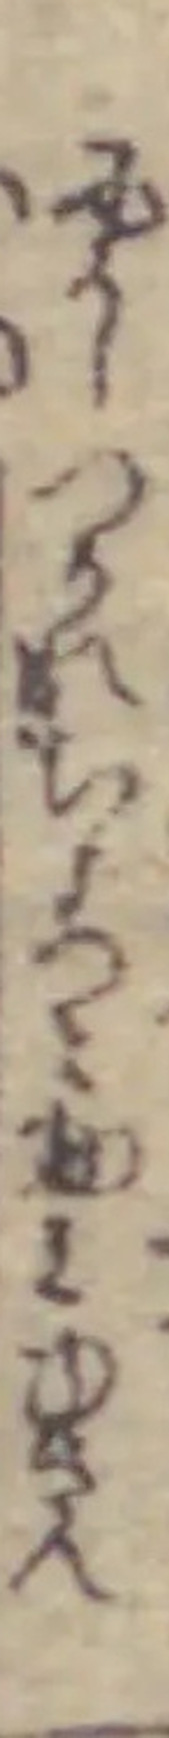にかしつかれちよつと物みゆさん
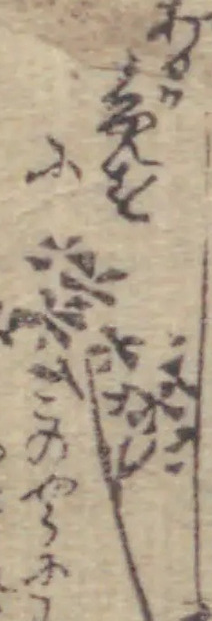しやんす
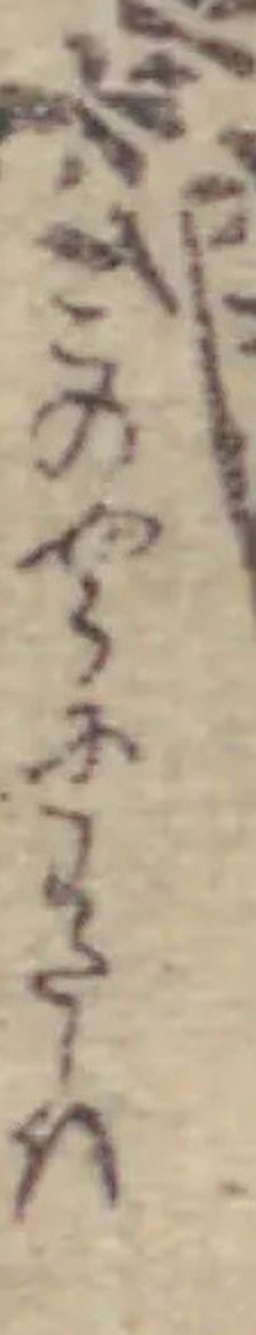このやうにわたしは
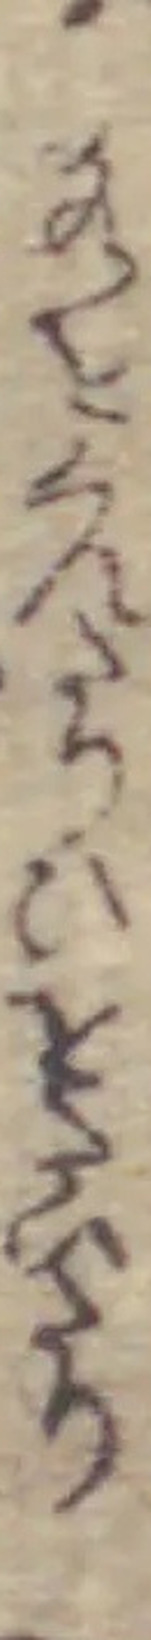水をくんたらひをたいたり
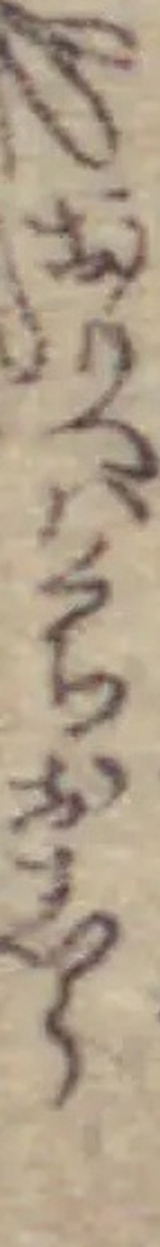おもへはくちおしう
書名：奥州咄 3巻
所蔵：国立国会図書館 National Diet Library, JAPAN
